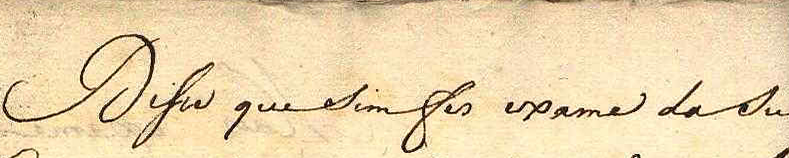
Disse que sim fes exame da Su
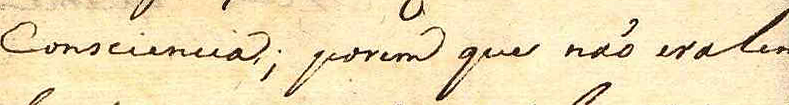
Consciencia; porem que naõ era lem
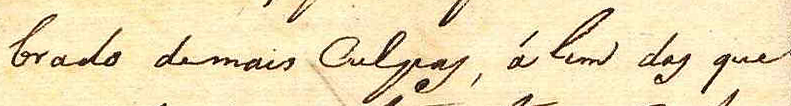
brado de mais Culpas, álem das que
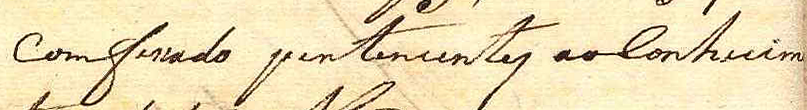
Comfessado pentencentes ao Conhecim
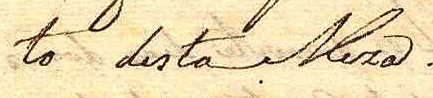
to desta Meza.
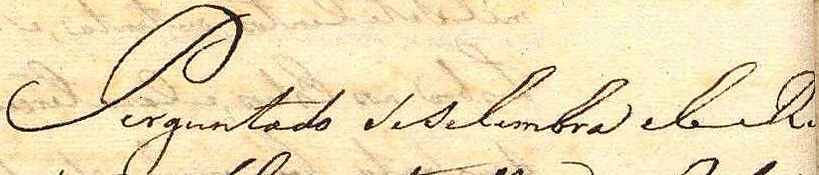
Perguntado se se lembra ele Re
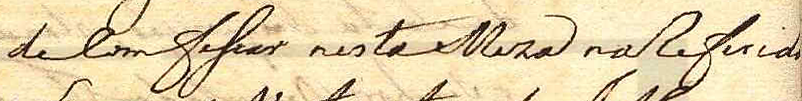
de Comfessar nesta Meza na Referid
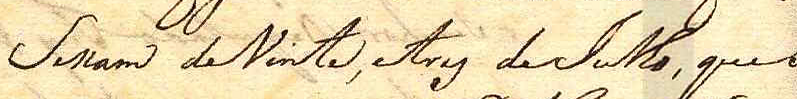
Sessam de Vinte, e tres de Iulho, que
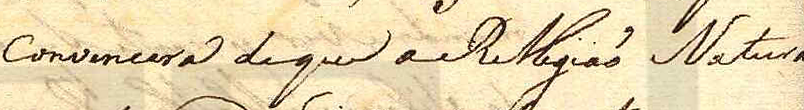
convencera de que a Relllgiaõ Natura
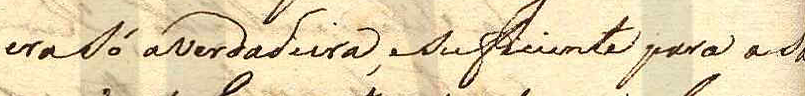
era Só a verdadeira, e suficiente para a S
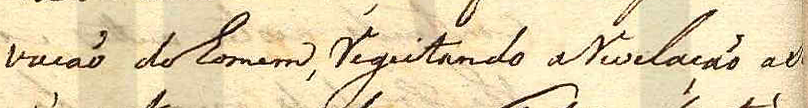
vaçaõ do homem, Regeitando a Revelaçaõ as
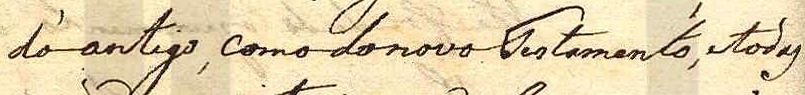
do antigo, como do novo Testamento, e todas
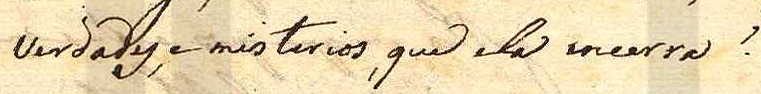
verdades, e misterios, que ela encerra?
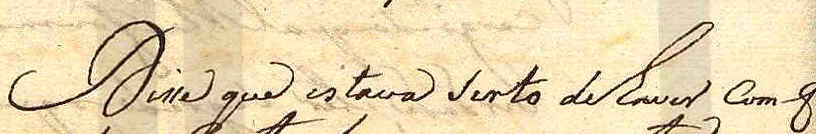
Disse que estava serto de haver Comf
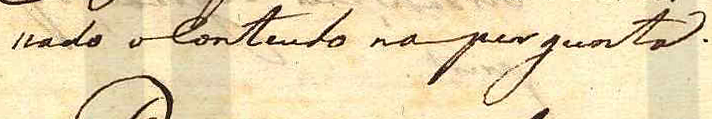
ssado o Conteudo na pergunta.
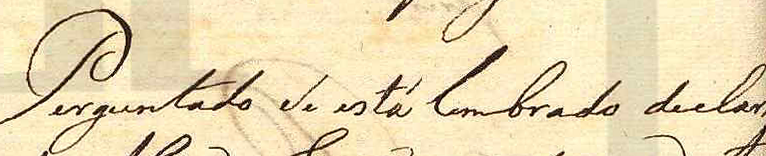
Perguntado se está lembrado declar
